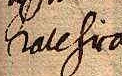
ratefica
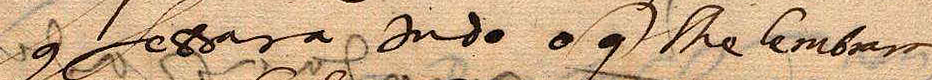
ꝯfessara tudo o q̄ lhe lembrara
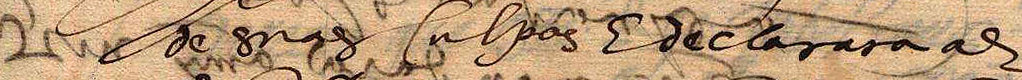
de suas Culpas E declarara as
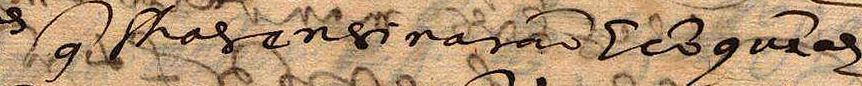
pas q̄ lhas ensinaraõ E cō quē as
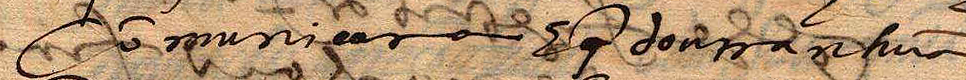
Cōmunicara E q̄ doutra nhuā
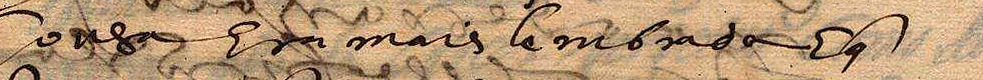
Cousa Era mais lembrada E q̄
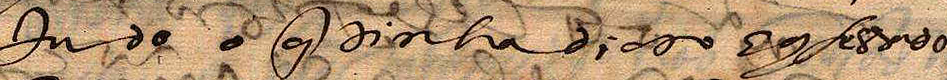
tudo o q̄ tinha dicto E ꝯfessado
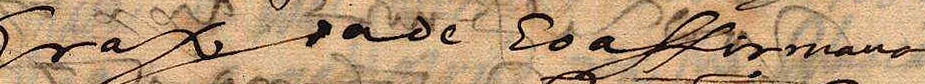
Era ꝟdade E o affirmaua
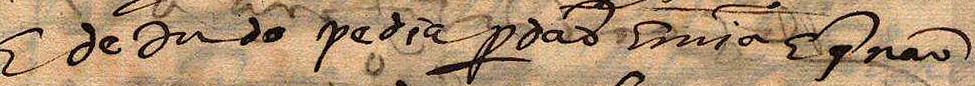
E de tudo pedia ꝑdaõ E mīa E q̄ naõ
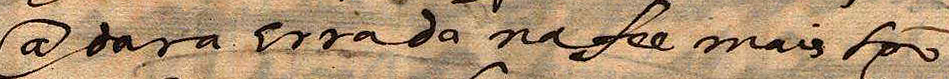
ādara Errada na fee mais tpō
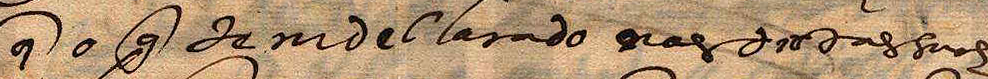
q̄ o q̄ tem declarado nas dictas suas
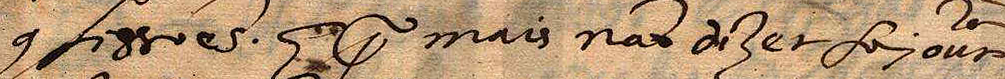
ꝯfissoẽs E p̄o mais naõ dizer foj outra
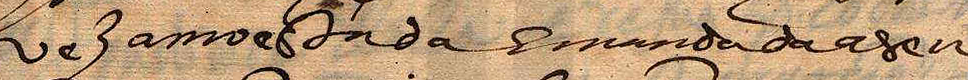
vez amoestada E mandada a seu
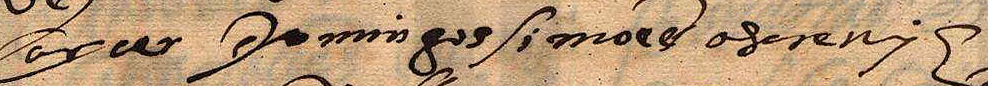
Carcer Domingos Simoeẽs o screuy E
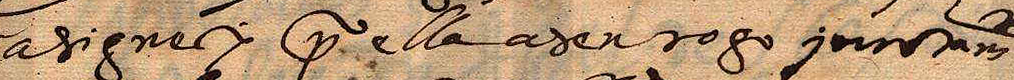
asigney p̄o ella a seu rogo junctamte
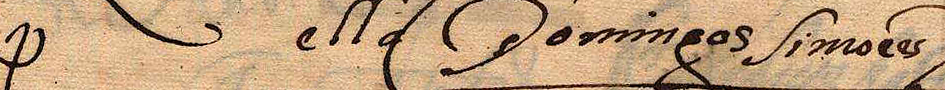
p̄o ella Domingos Simoeẽs
